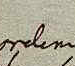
ordem
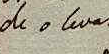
de o levar
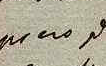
prezo pa
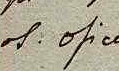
o S. oficio
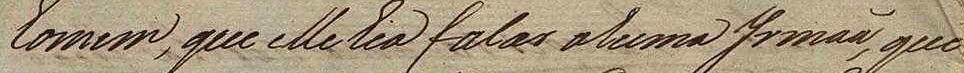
homem, que elle hia falar a huma Jrmaã, que
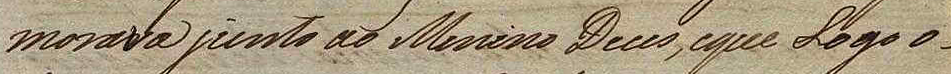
morava junto ao Menino Deus, e que Logo o
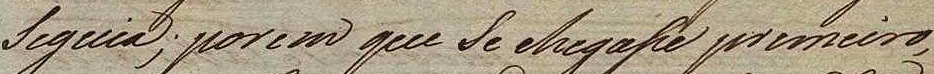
Seguia; porem que Se chegasse premeiro,
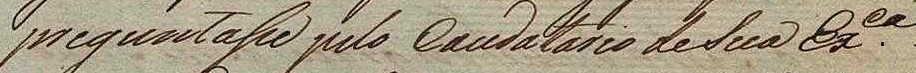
preguntasse pelo caudatario de Sua Ex.ca
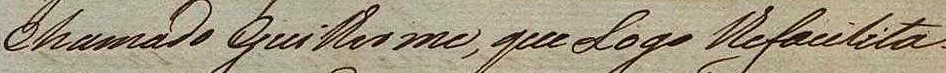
chamado Guilherme, que Logo lhe facilita
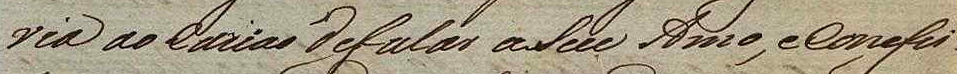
ria a ocaziaõ de falar a seu Amo, e con efei
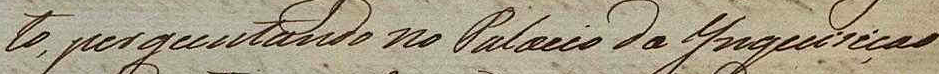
to, perguntando no Palacio da Jnquisiçaõ
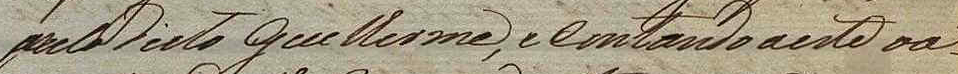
pelo dicto Guilherme, e contando a este o a
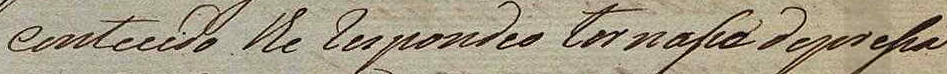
contecido lhe Respondeo tornasse depressa
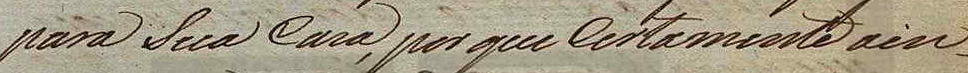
para Sua caza, porque certamente a in
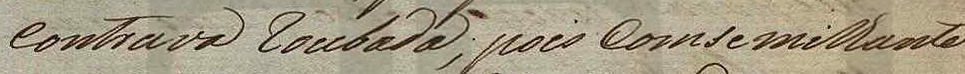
contrava Roubada, pois com semilhante
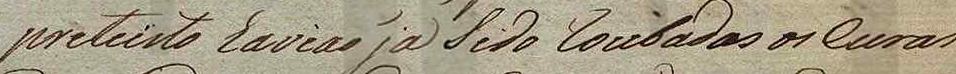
preteisto haviaõ ja Sido Roubados os curas
